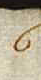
6
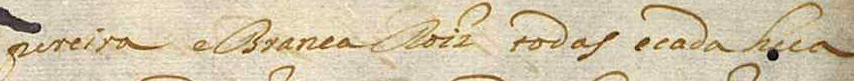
pereira e Branca Roiz̄ todas e cada hua
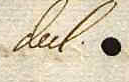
decl.
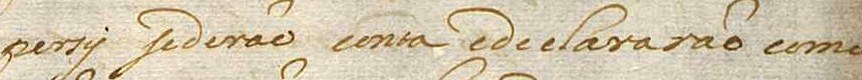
per sy se derão conta e declararaõ como
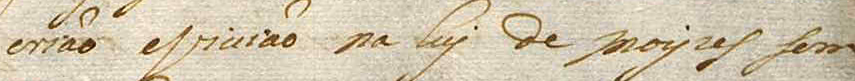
criaõ e Viviaõ na ley de moyzes sem
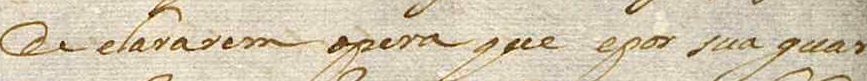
declararem o pera que e por sua guar
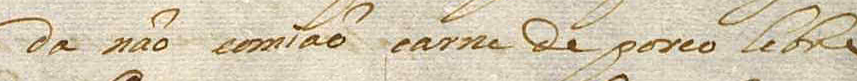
da naõ comiaõ carne de porco lebre
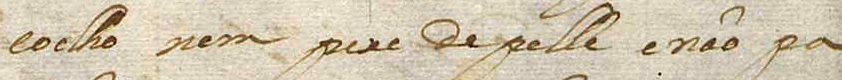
coelho nem pexe de pelle e não pa
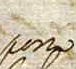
porco
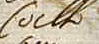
Coelho
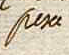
pexe
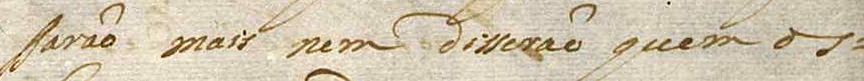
ssaraõ mais nem disseraõ quem os
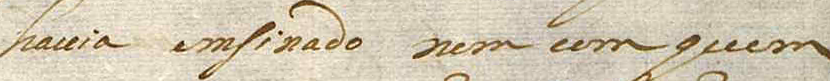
hauia emsinado nem com quem
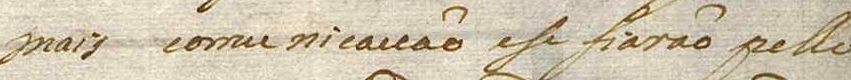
mais comunicauaõ e se fiaraõ pello
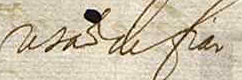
rezaõ de fiar
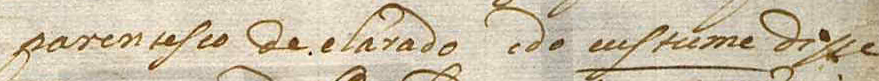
parentesco declarado e do custume disse
